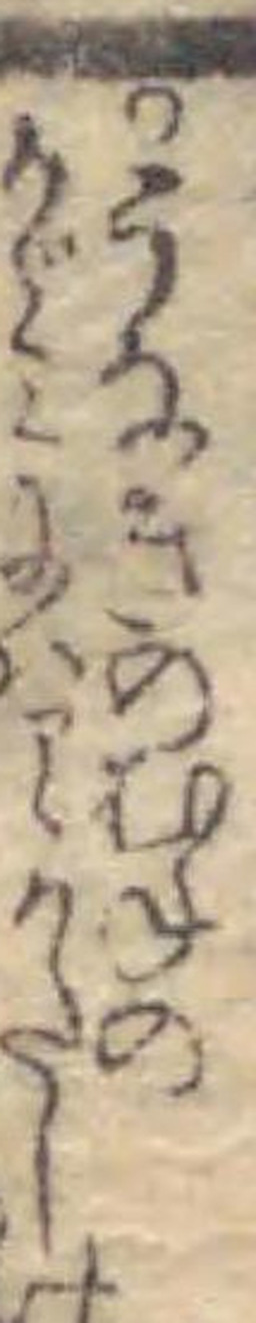かゞみにはアヽかたしけ
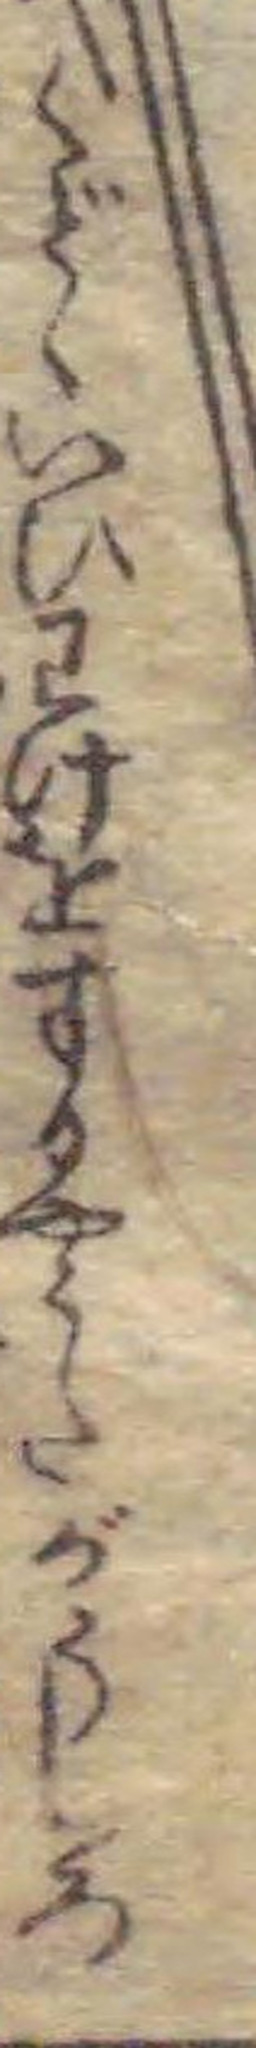〽くどくいひわけをするやうたがうしろ
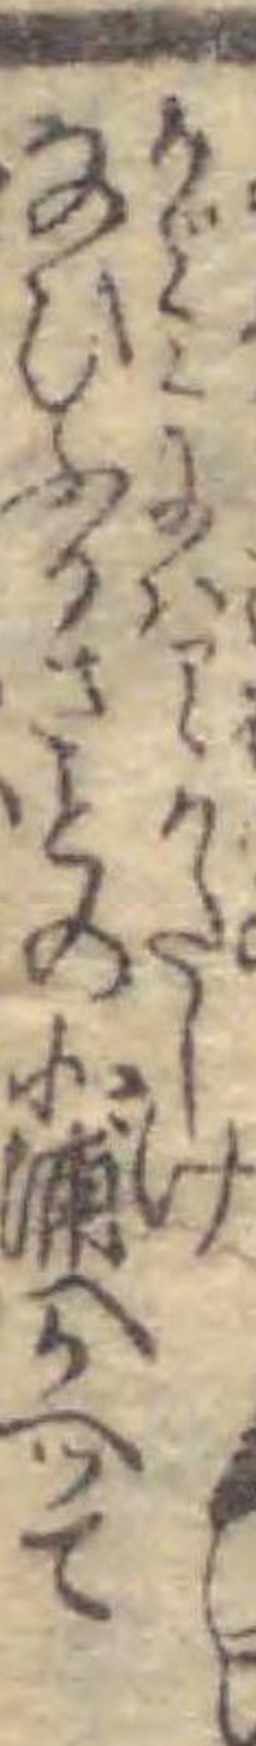なひふるさとの北浦へかへつて
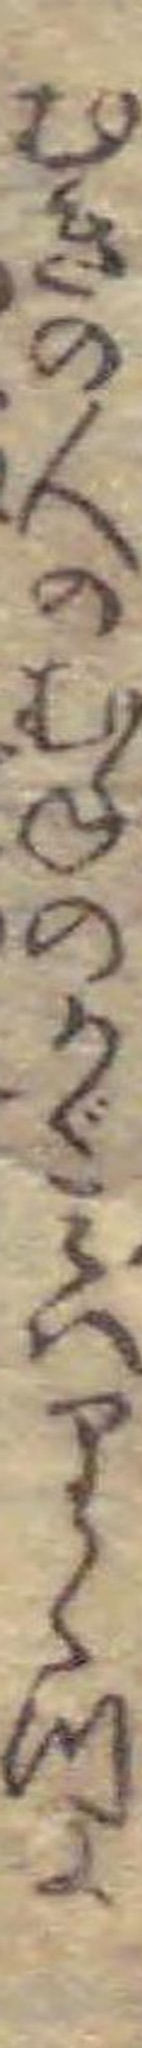むきの人のむねのかゞみはりくつに
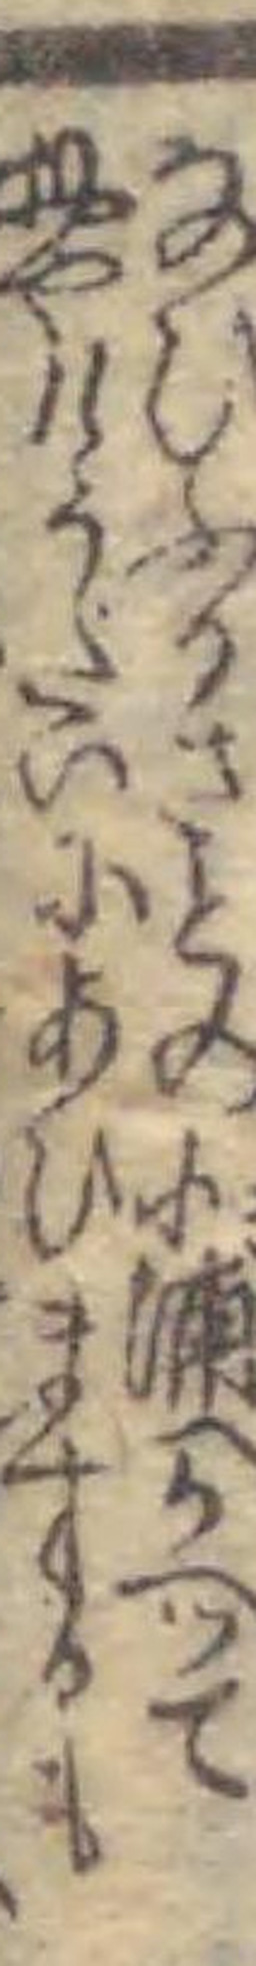おやけうだいにあひまするも
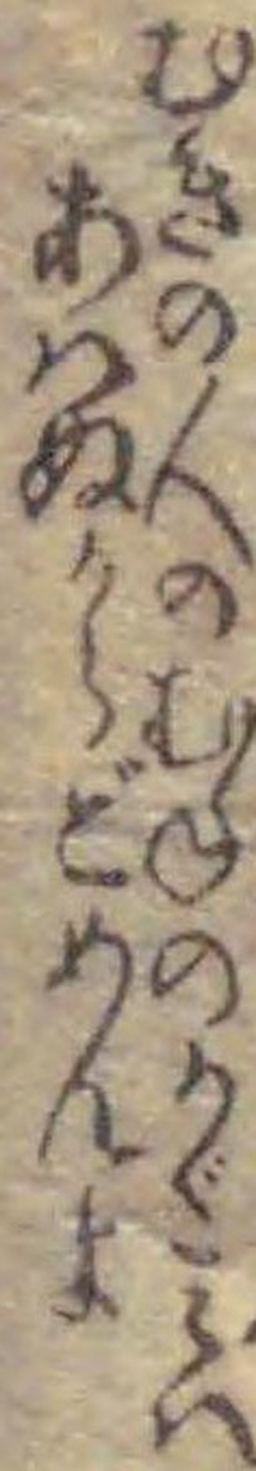あはぬからごめんよ
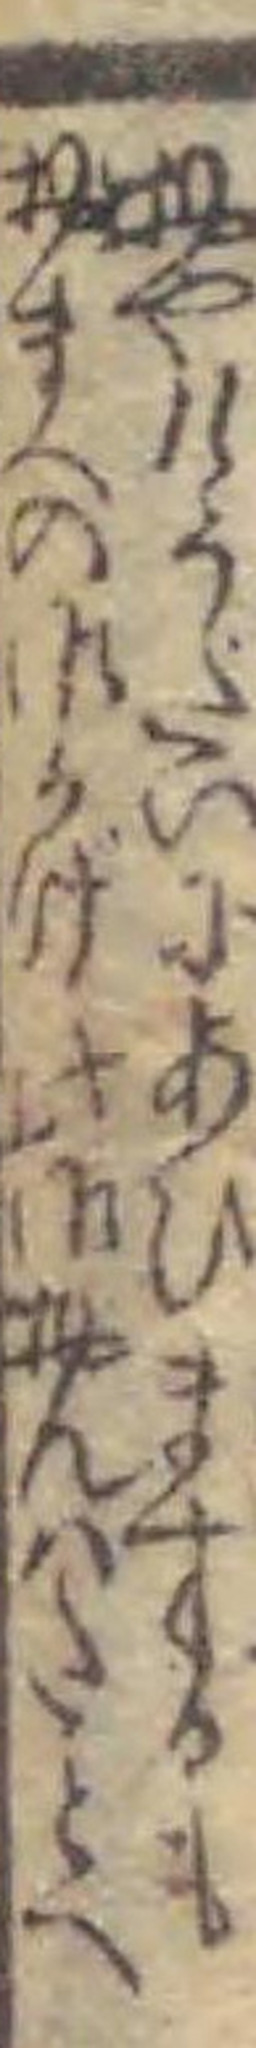おまへの御かげ此御おんはたとへ
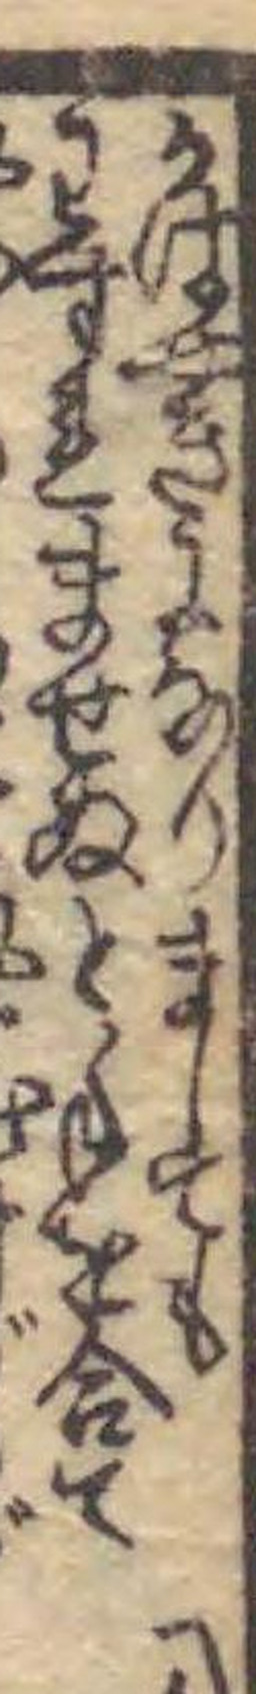わすれませぬと手を合て
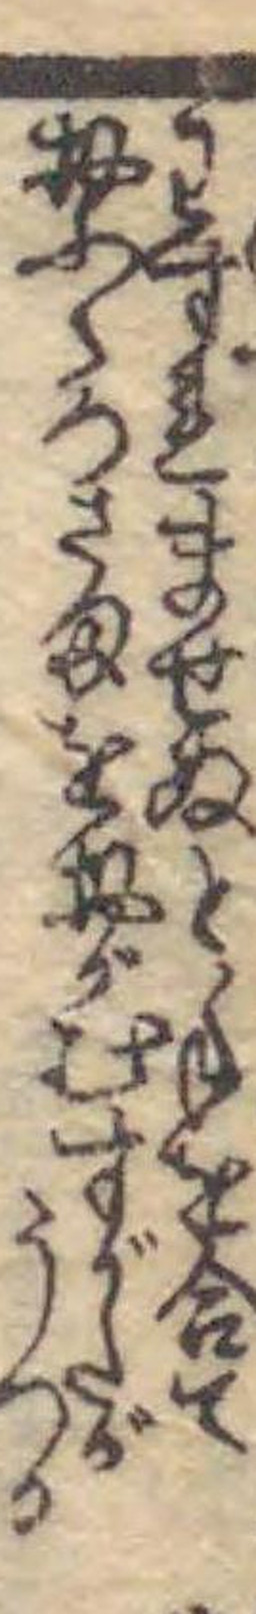おふくろさまをおがむすがたが
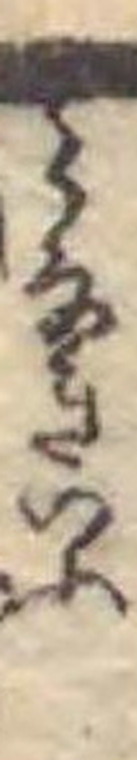うなきいふ
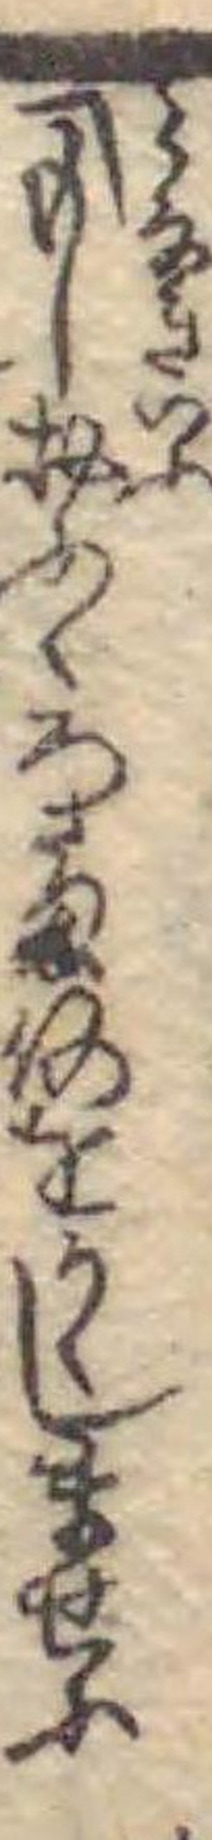〽もしおふくろさま何をかくしませふ
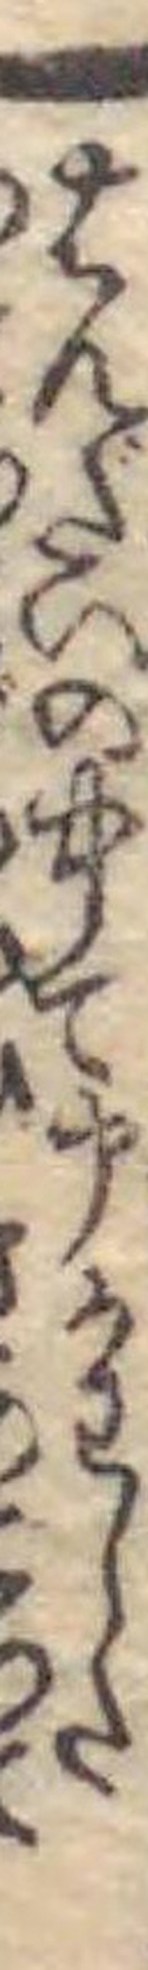はんだいの中て申かわした
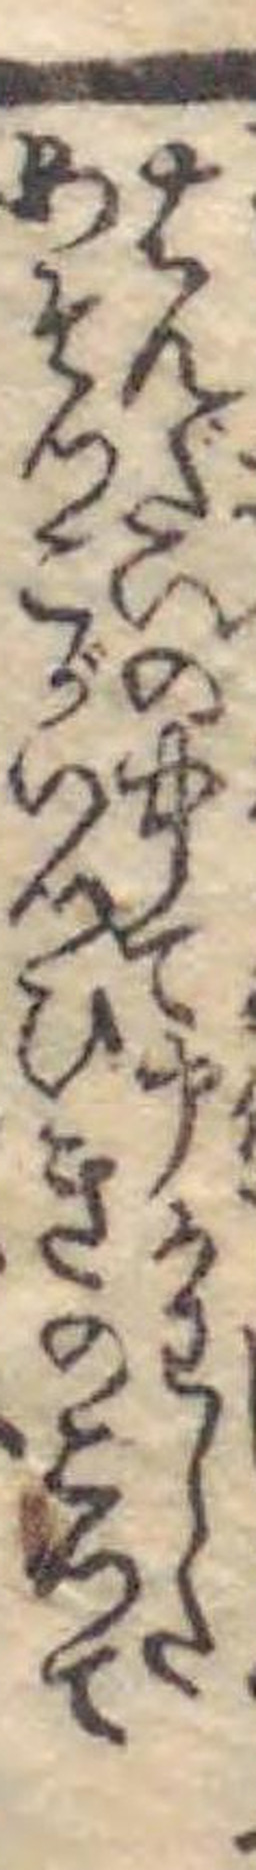めそつこがいつひきのこつて
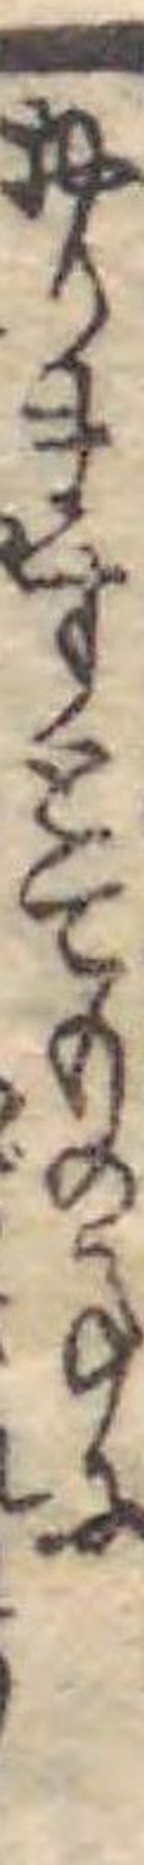おりますとてもの事に
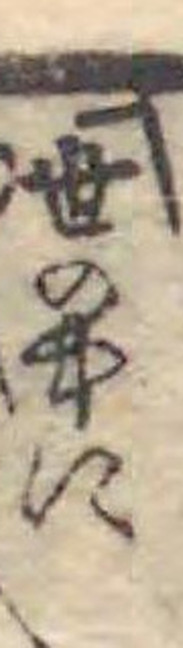〽世の中に
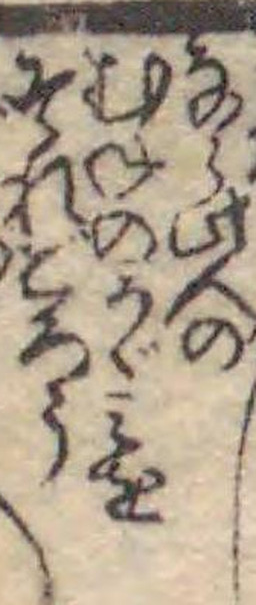それごろう
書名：人心鏡写絵 : 3巻
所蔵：国立国会図書館 National Diet Library, JAPAN
